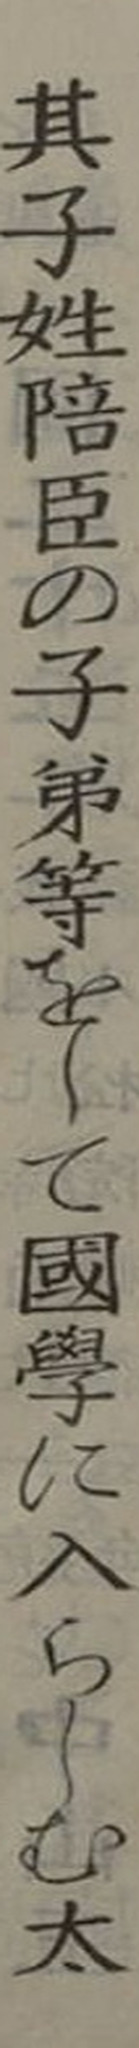其子姓陪臣の子弟等をして國學に入らしむ太
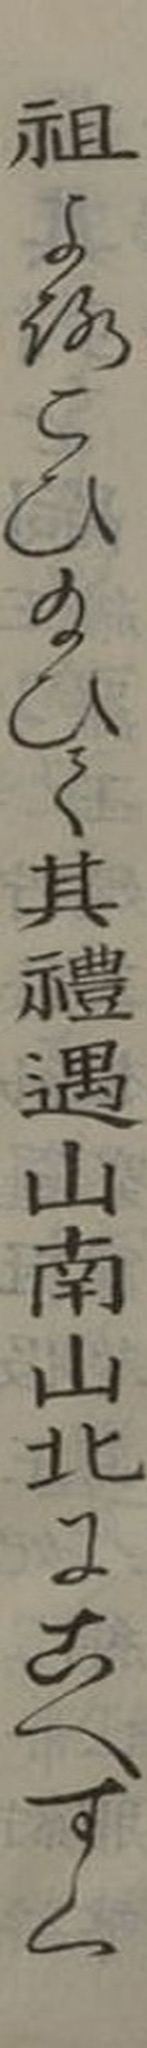租よろこひ給ひて其禮遇山南山北にこへすく
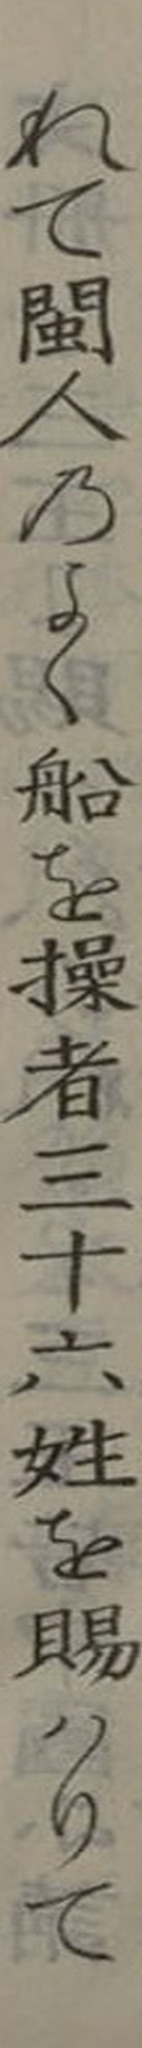れて閩人のよく船を操者三十六姓を賜はりて
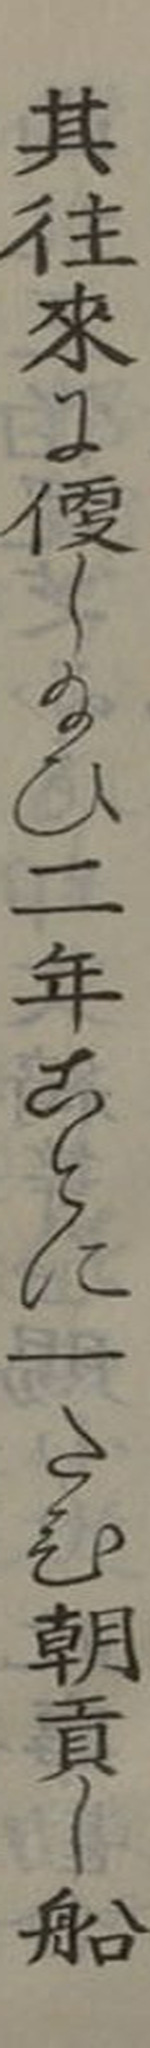其往來にし給ひ二年ことに一たひ朝貢し船
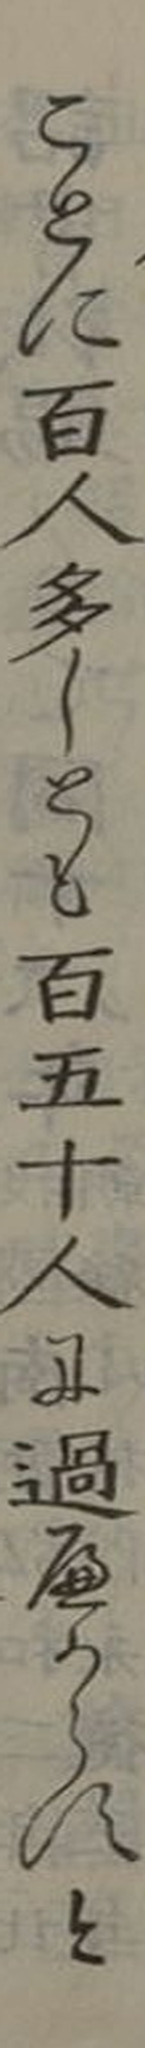ことに百人多しとも百五十人に過へからすと
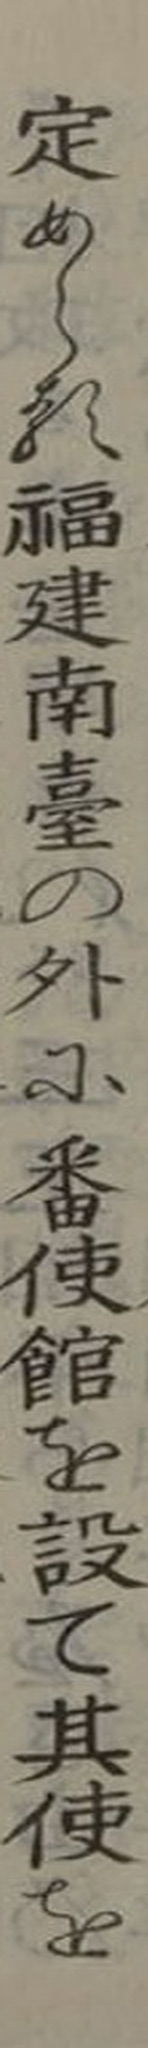定めらる福建南臺の外に番使館を設て其使を
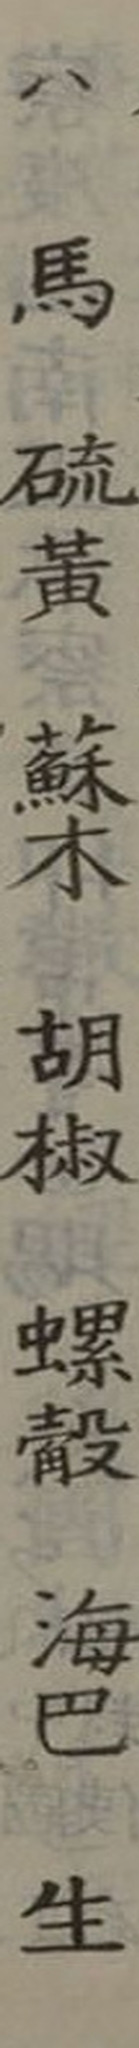は馬硫黃蘇木胡椒螺殼海巴生
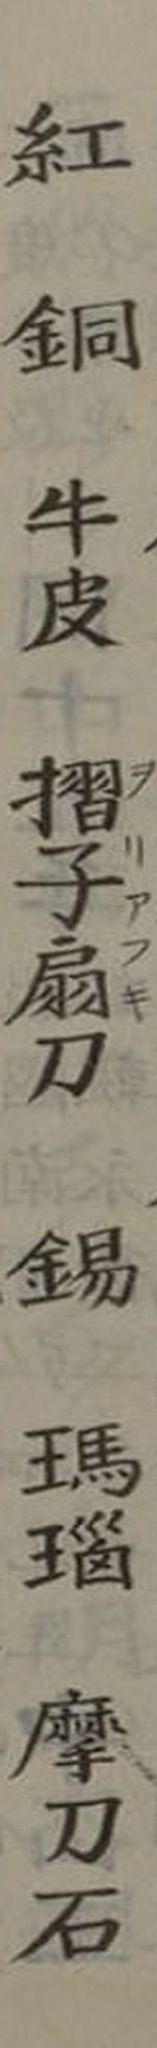紅銅牛皮摺子扇刀錫瑪瑙摩刀石
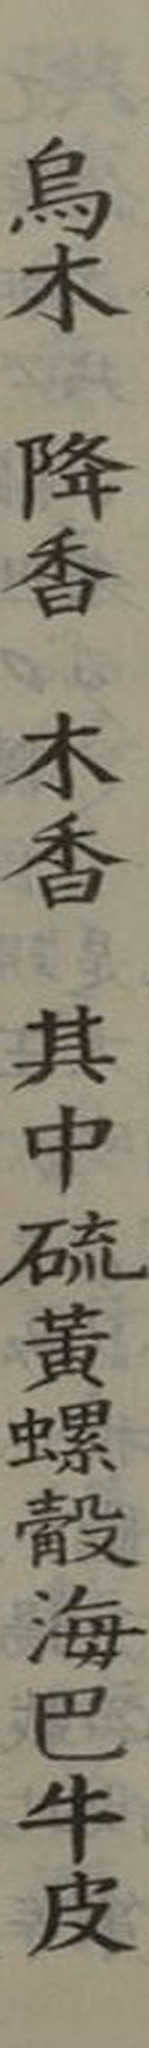烏木降香木香其中硫黃螺殼海巴牛皮
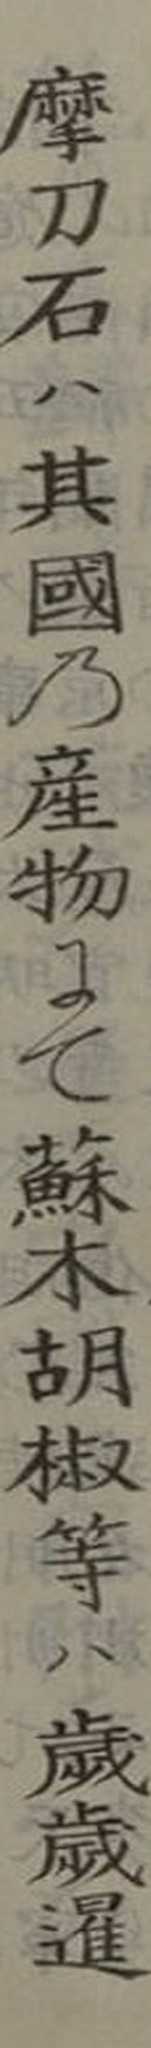摩刀石は其國の產物にて蘇木胡椒等は歲歲暹
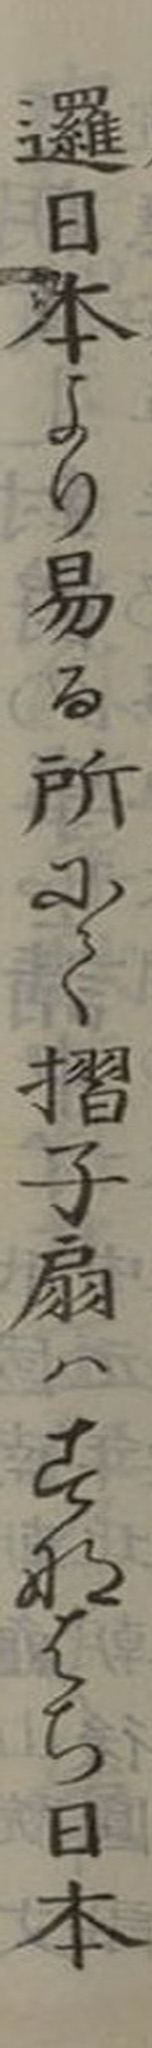羅日本より易る所にて摺子扇はすなはち日本
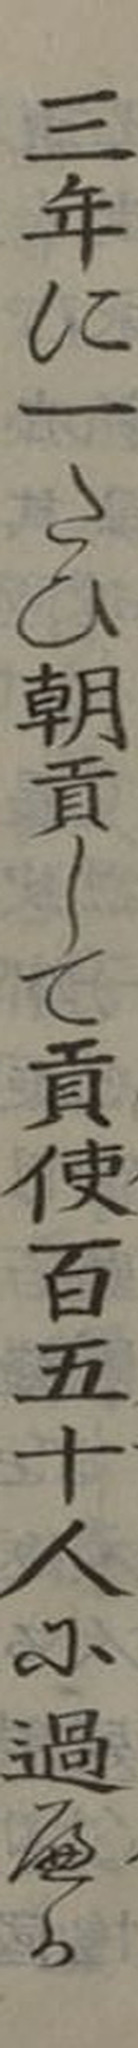三年に一たひ朝貢して貢使百五十人に過へか
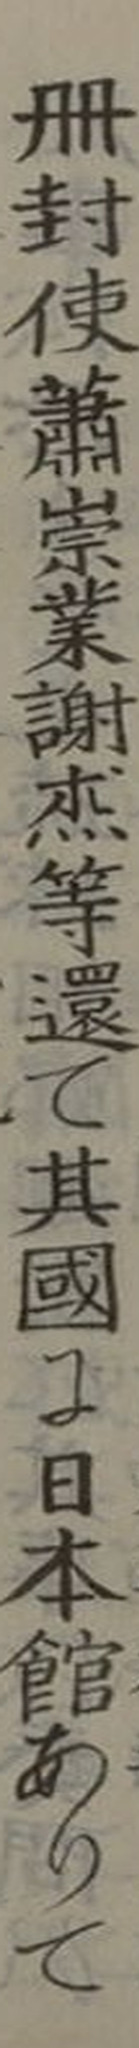册封使蕭崇業謝杰等還て其國に日本館ありて
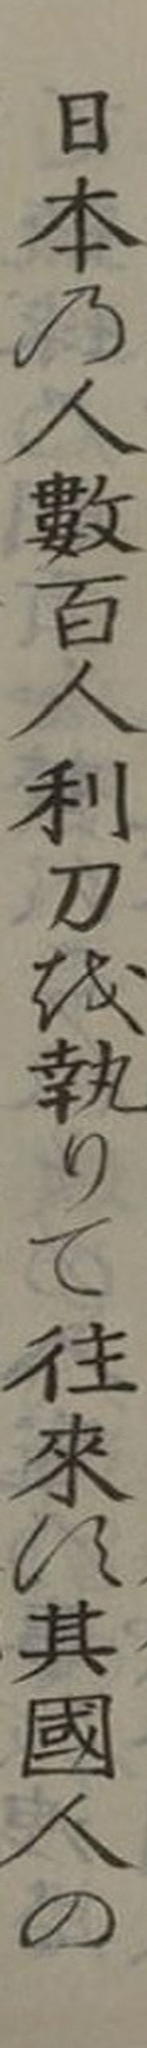日本の人數百人利刀を執りて往來す其國人の
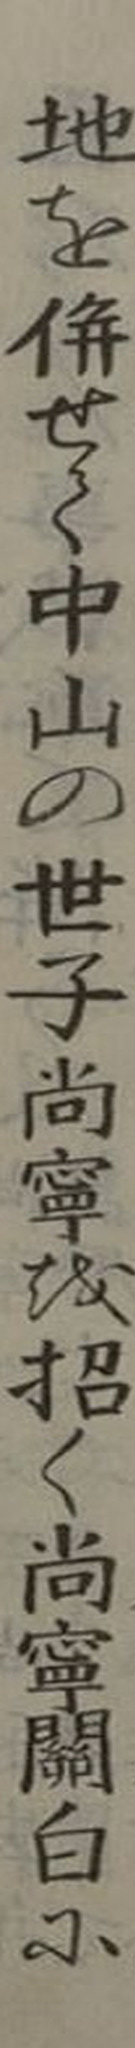地を併せて中山の世子尚寧を招く尚寧關白に

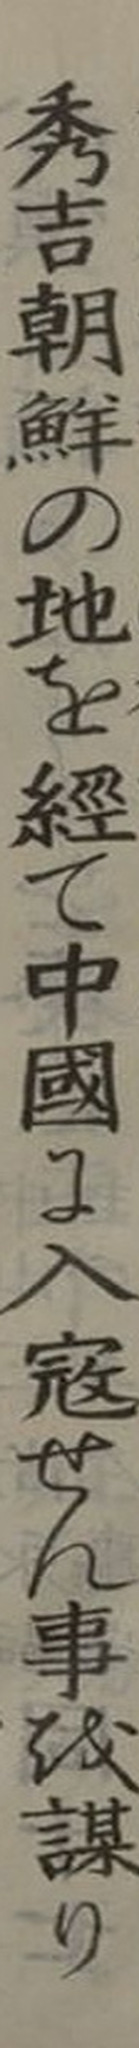秀吉朝鮮の地を經て中國に入寇せん事を謀り
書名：骨董録
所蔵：University of the Ryukyus Library
